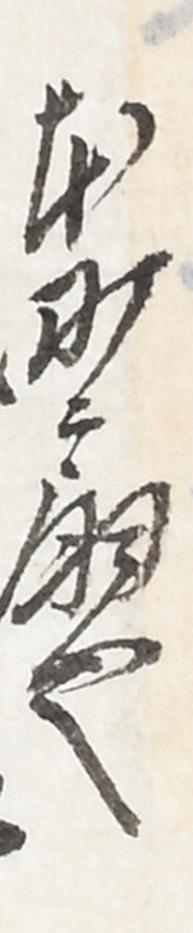本町扇や
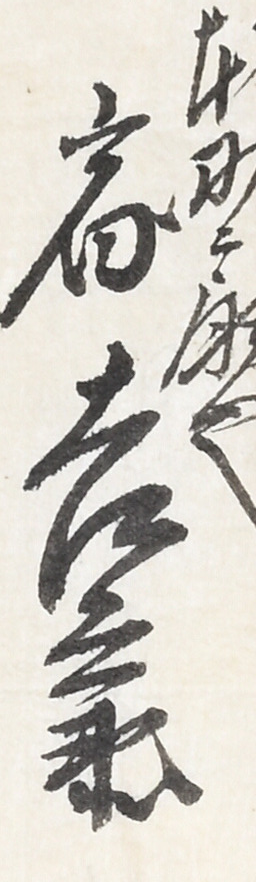宿吉兵衛
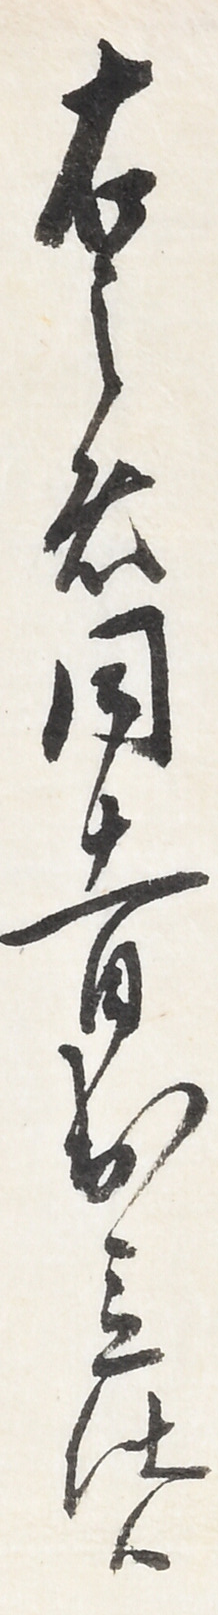右之者同十一日出立仕候
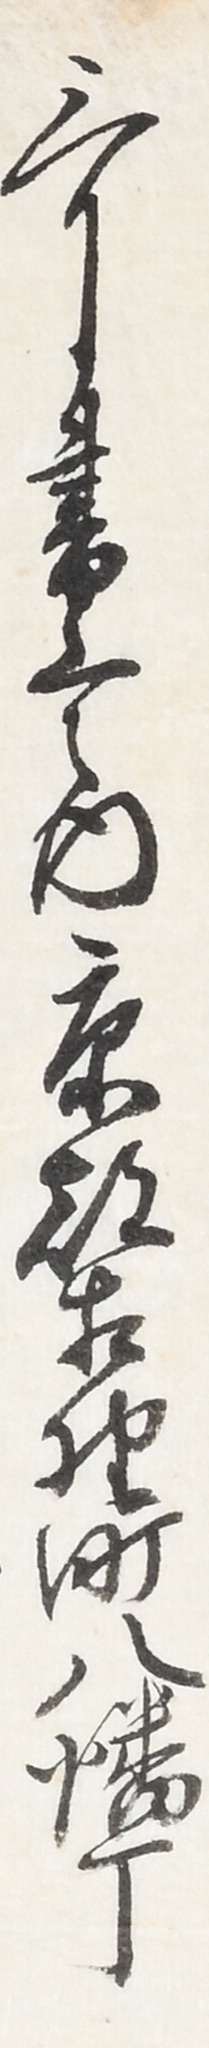三月書上之内京都相野町八幡丁
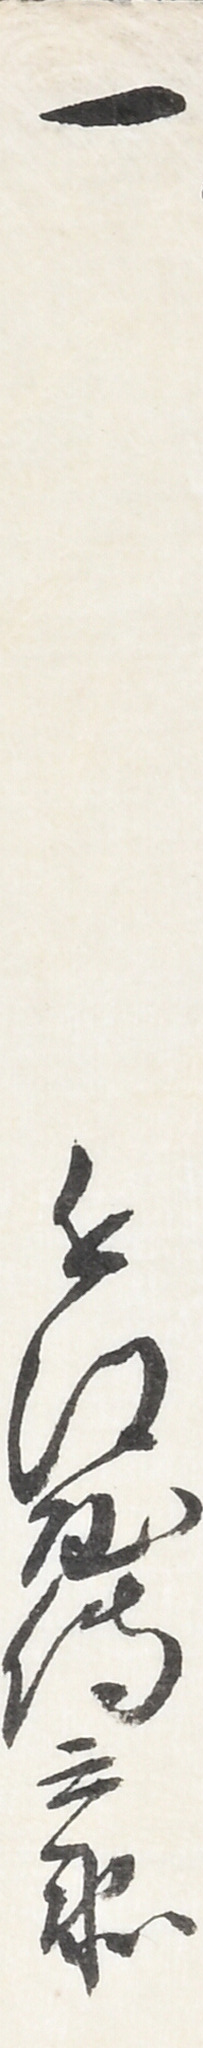一近江屋伝兵衛
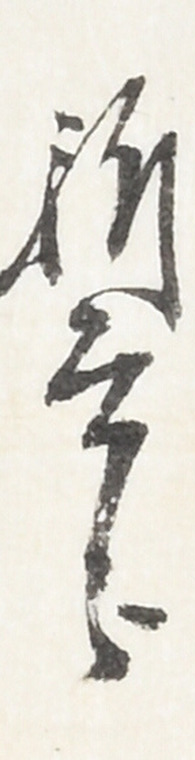新太郎
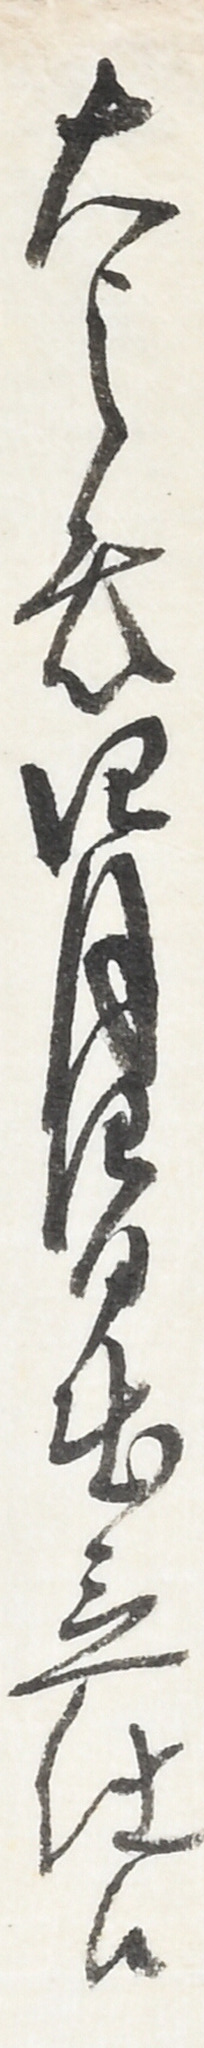右之者四月四日出立仕候
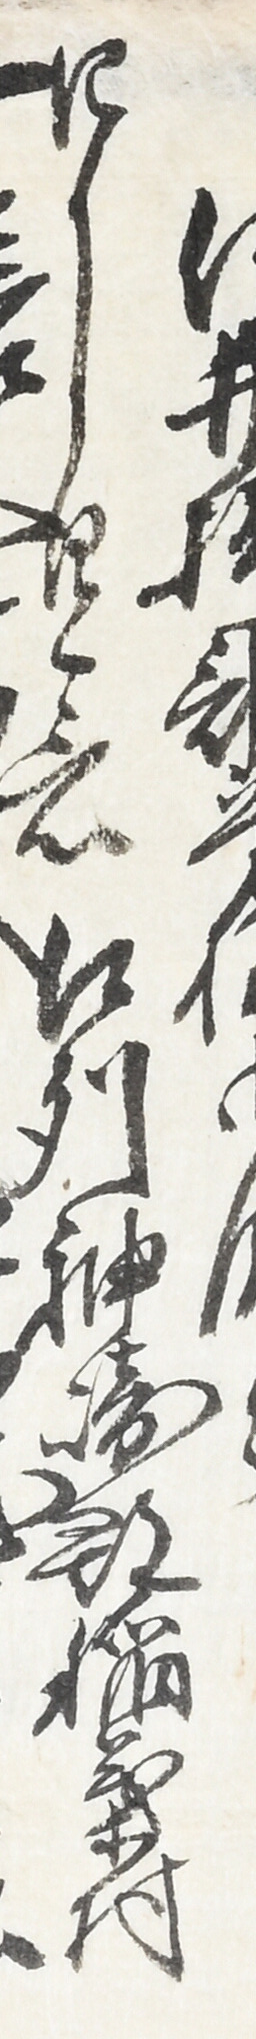四月四日着江州神崎郡稲葉村
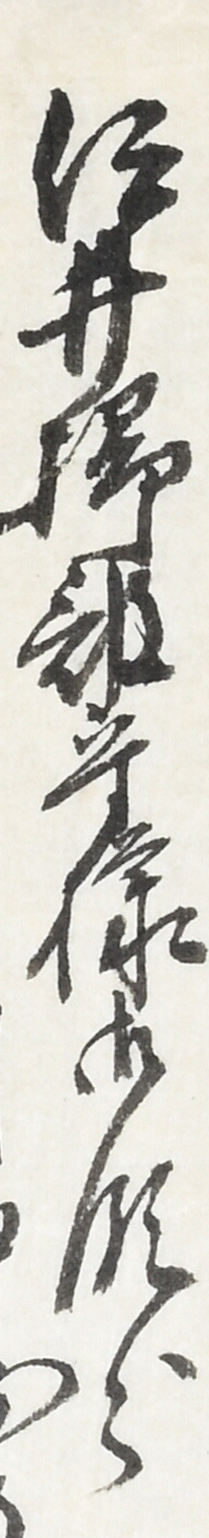井伊掃部守様御領分
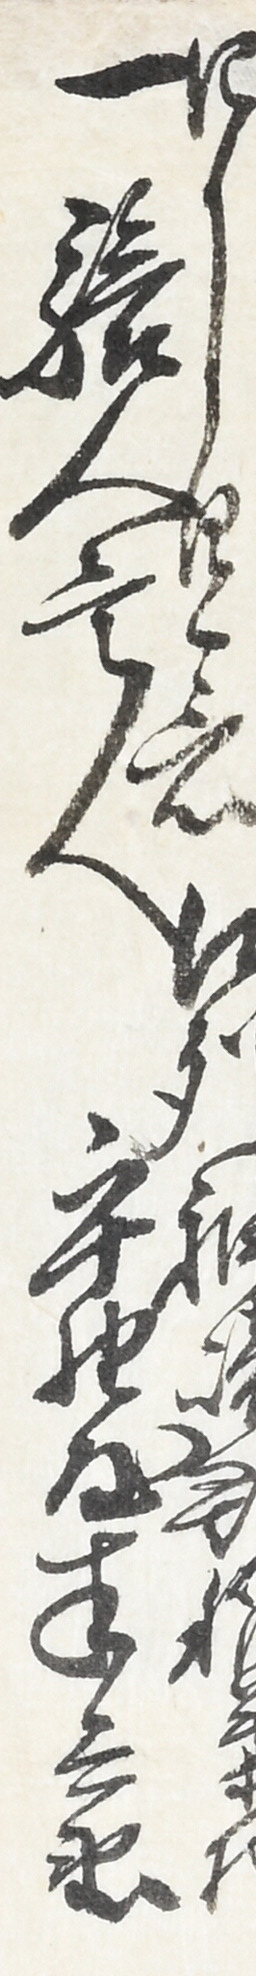一旅人壱人平野屋半兵衛
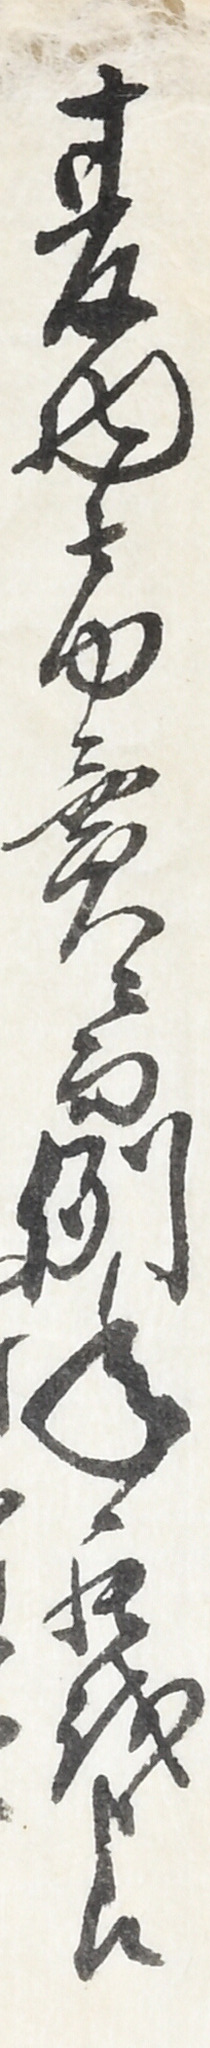夏物商売ニ而例年罷越申候
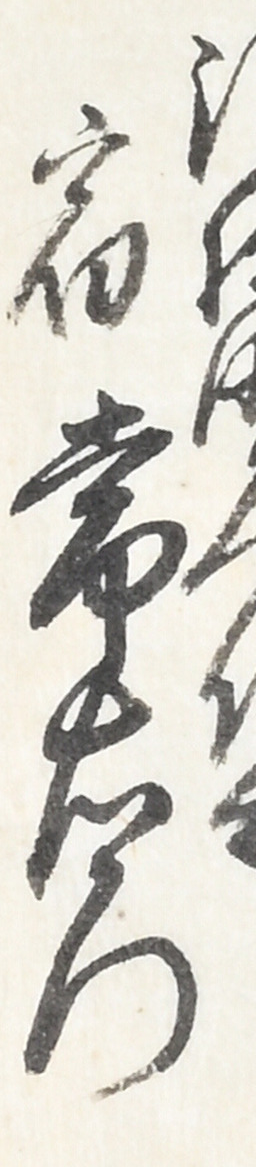宿常右衛門

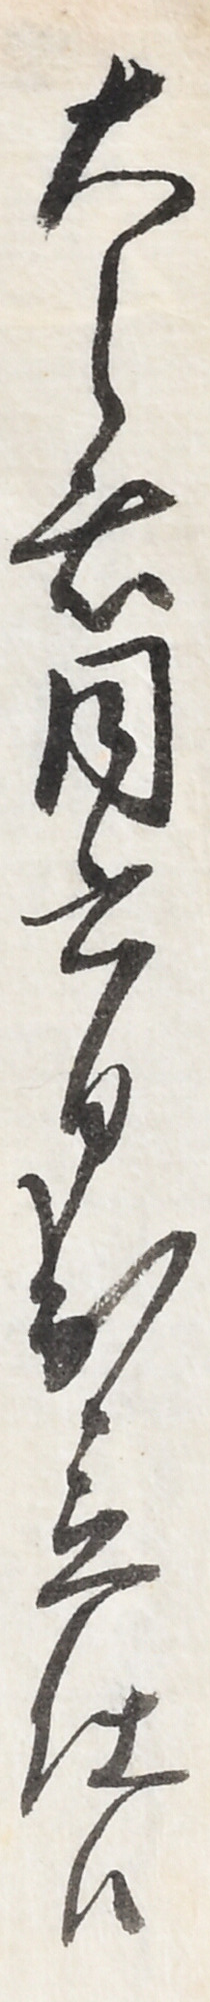右之者同六日出立仕候
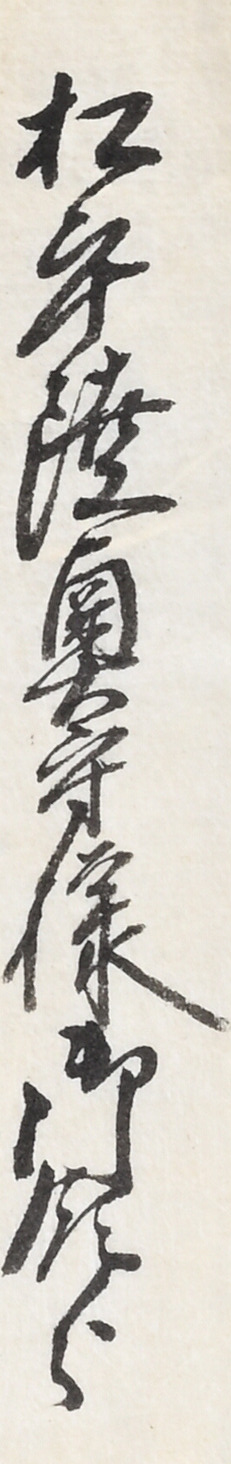松平陸奥守様御領分
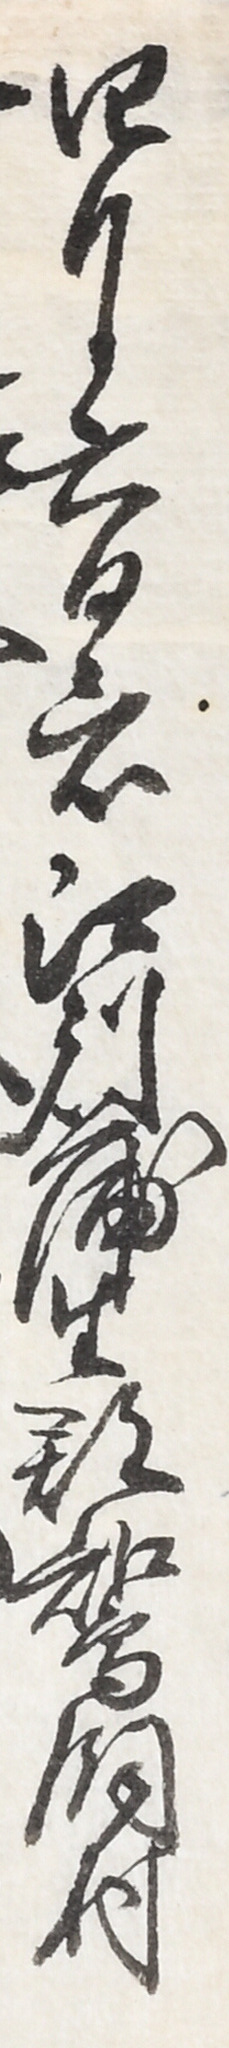四月六日着江州蒲生郡鷹飼村
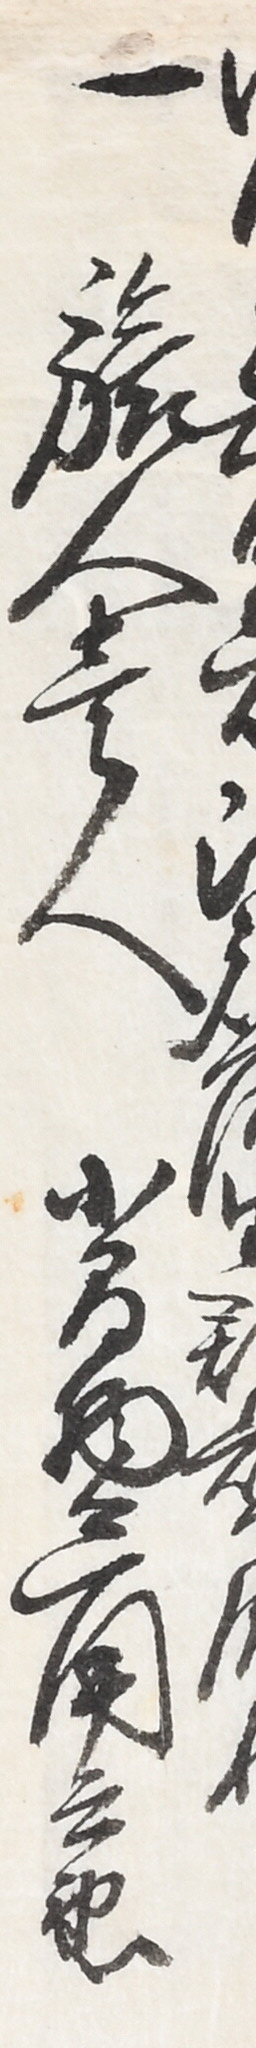一旅人壱人小間物や角兵衛
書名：旅人泊控帳
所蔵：伊那市立高遠町図書館・合同会社AMANE
